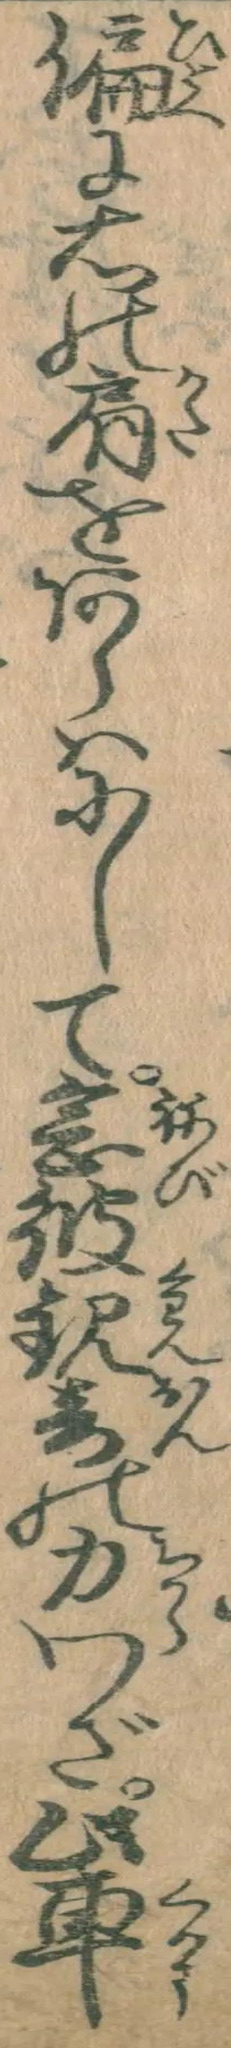偏に右の肩をあらはにして。念彼観音の力わざ。此車
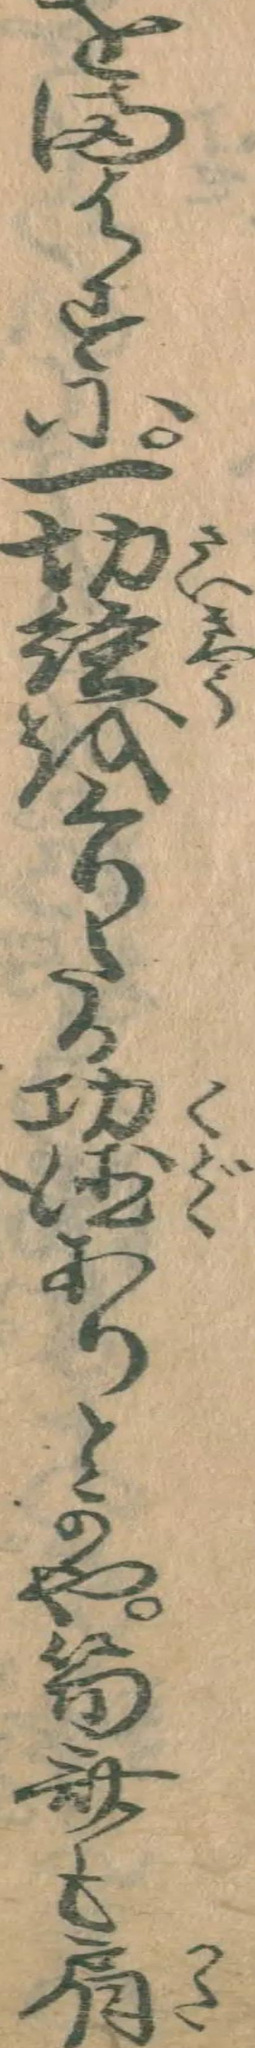をまはすに。一切経をくりたる功徳ありとかや。筍斎も肩

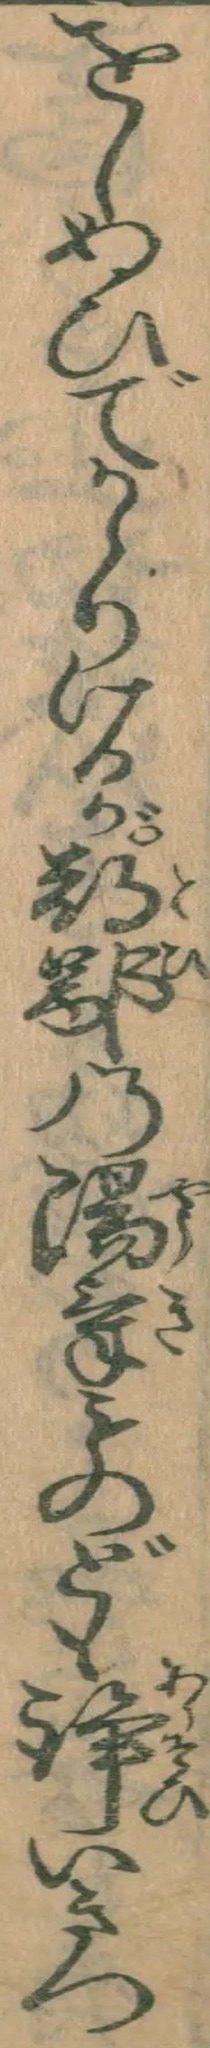をしぬひでかゝりけるが。都鄙の陽気ものども諍いきつ
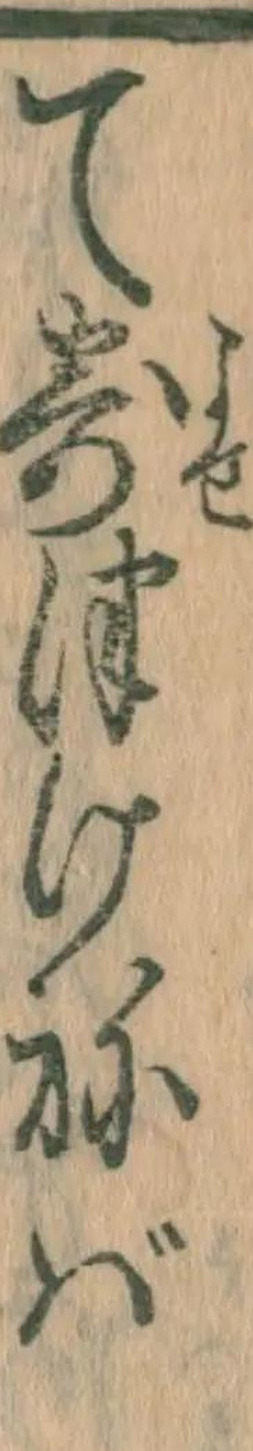て寄つけねば
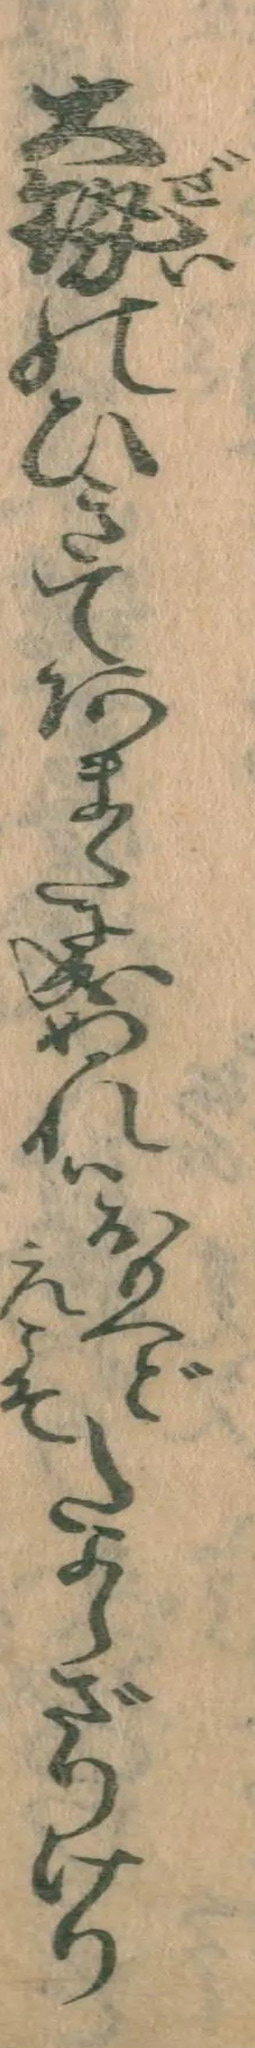大勢のひきてあまたに成ぬれはおもへどえこそたよらざりけり
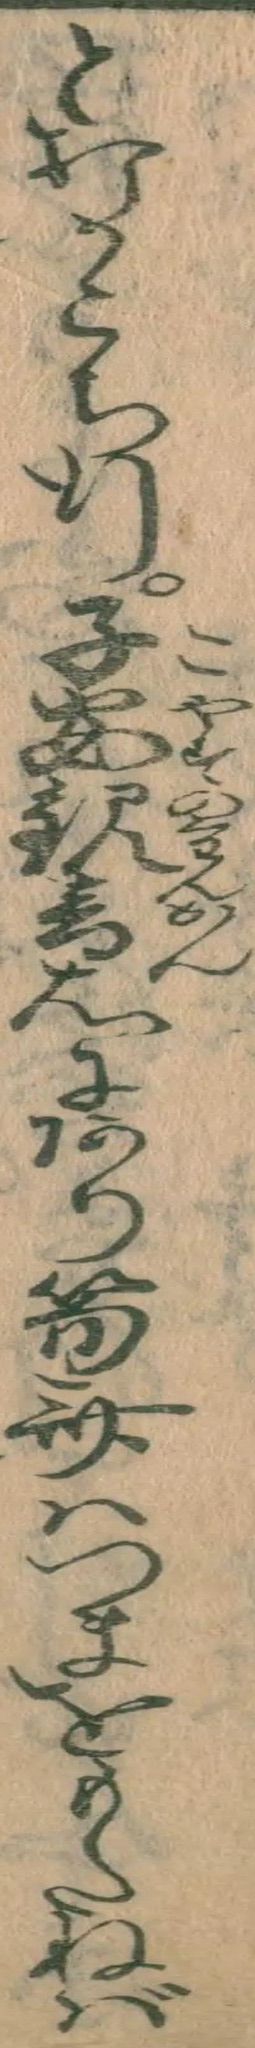と打かこち行。子安観音右にあり筍斎はつまをもたねば
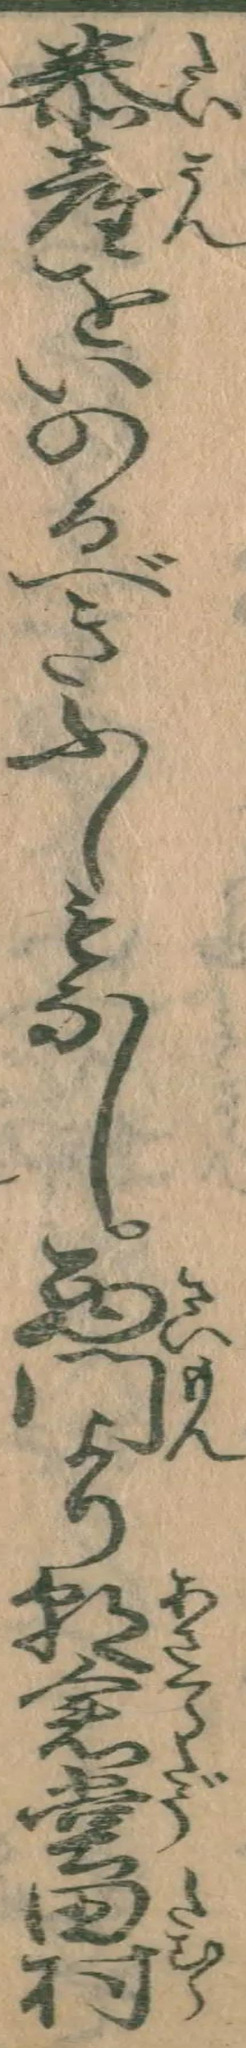泰産をいのるべきふしもなし。西門より朝倉堂田村
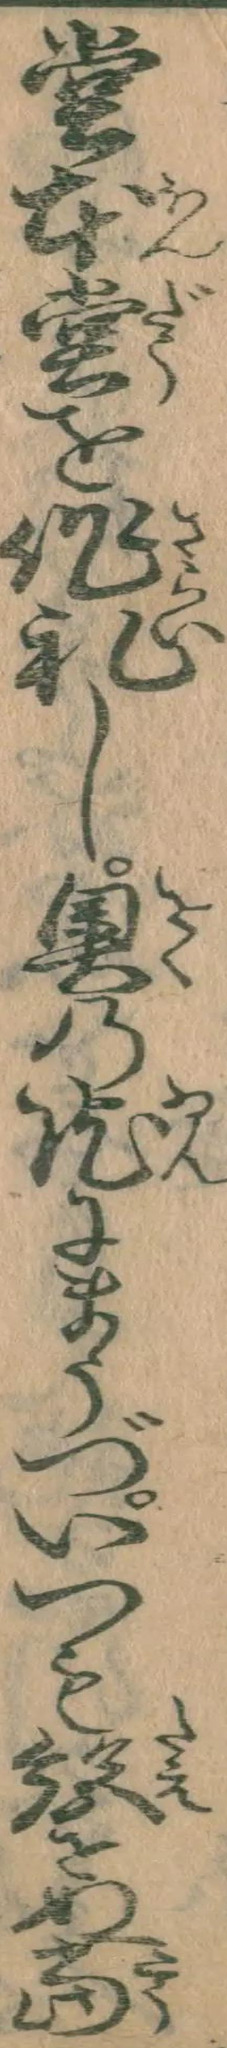堂本堂を作礼し。奥の院にまうづ。いつも絶せぬ当
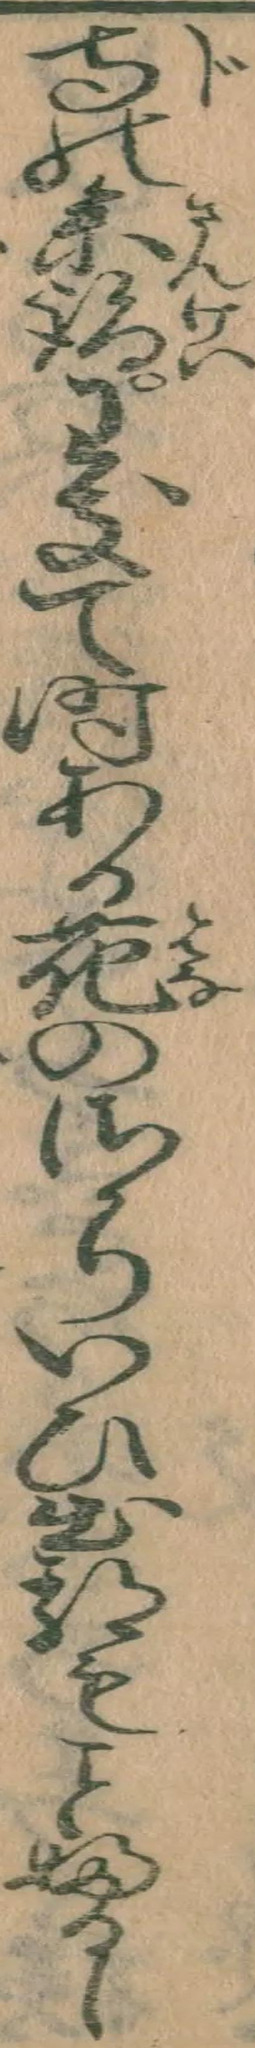寺の参詣。わきて時ある花のさかりいひ出るもことふるし
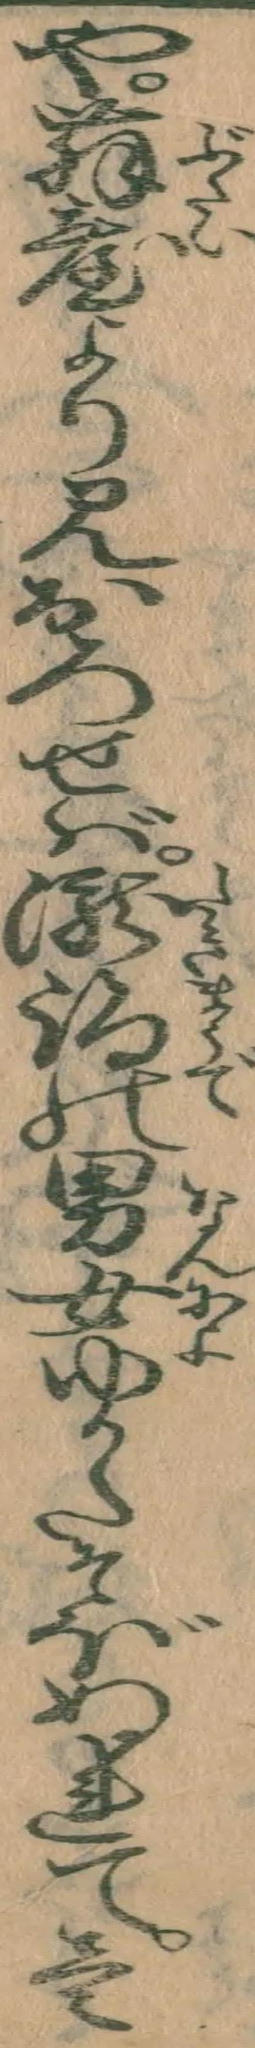や。舞台より見おろせば。滝詣の男女ゆかたそぼぬれて。壱
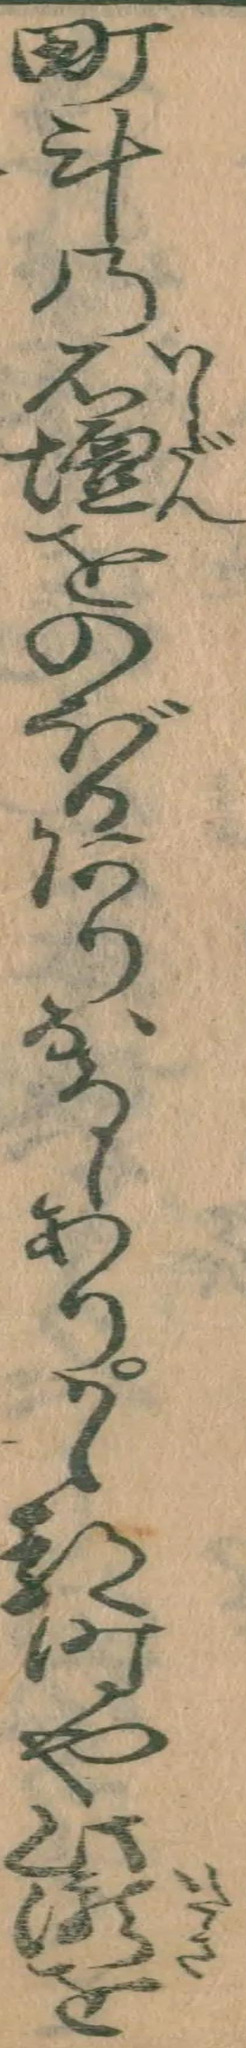町斗の石壇をのぼるありおるゝあり。かゝる時や此滝を
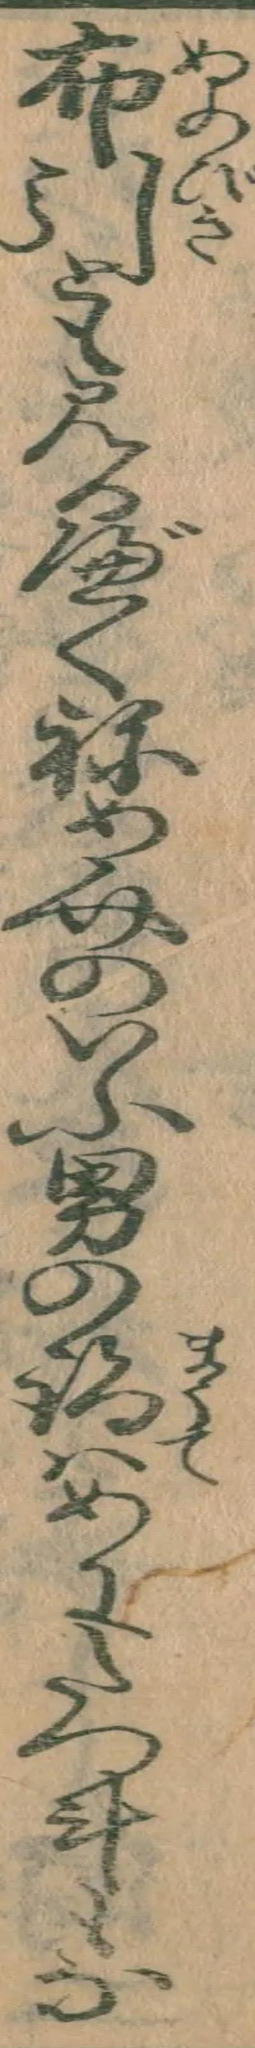布引とも見るべくねめ介のいふ男の詣はめにたつ斗もな
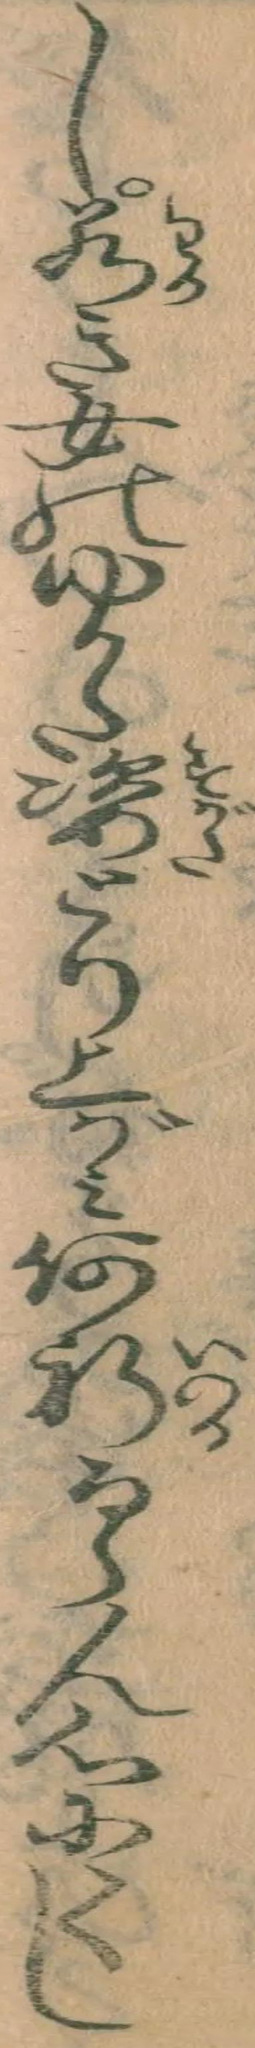し。若き女のゆかた姿とり上がみ何祈るらん心にくし
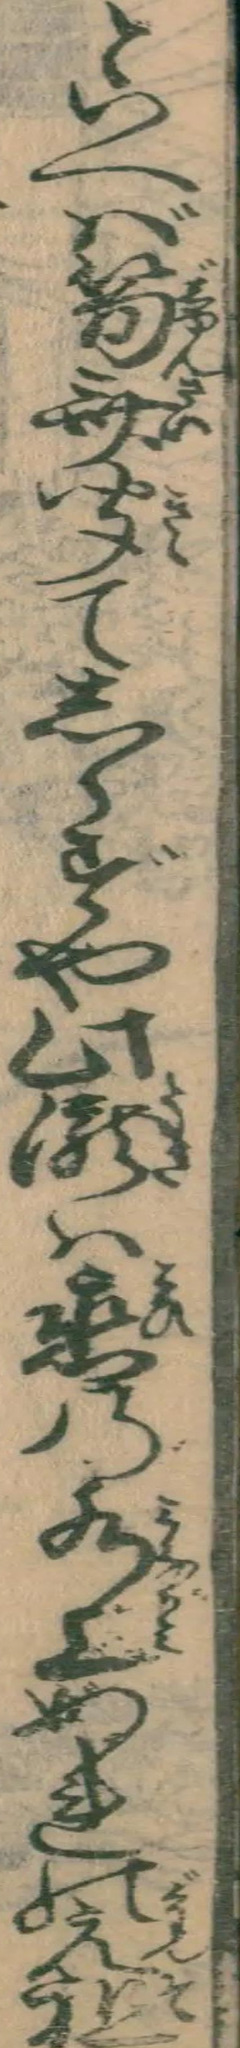といへば筍斎聞てしらずや此滝は恋の水上ぬれの元祖
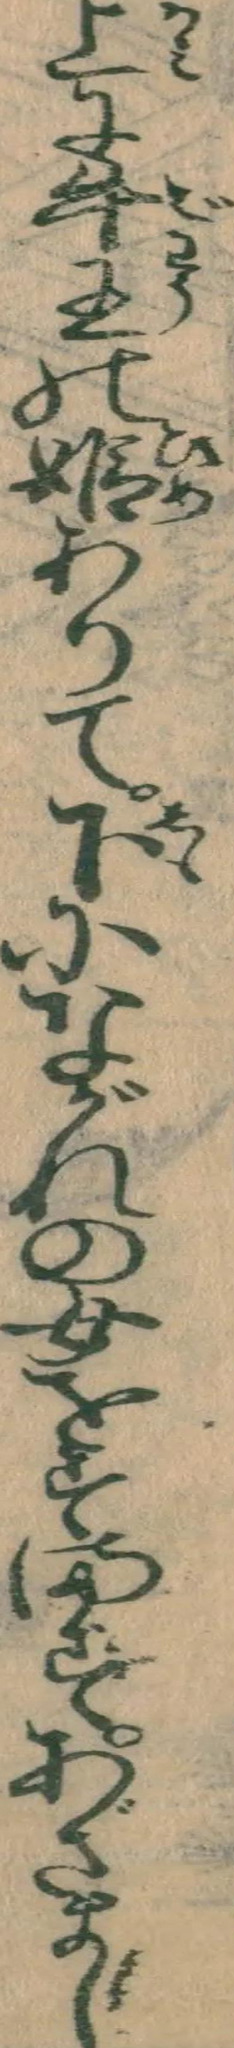上に牛王の姫ありて。下にながれの女をすます。あさまし
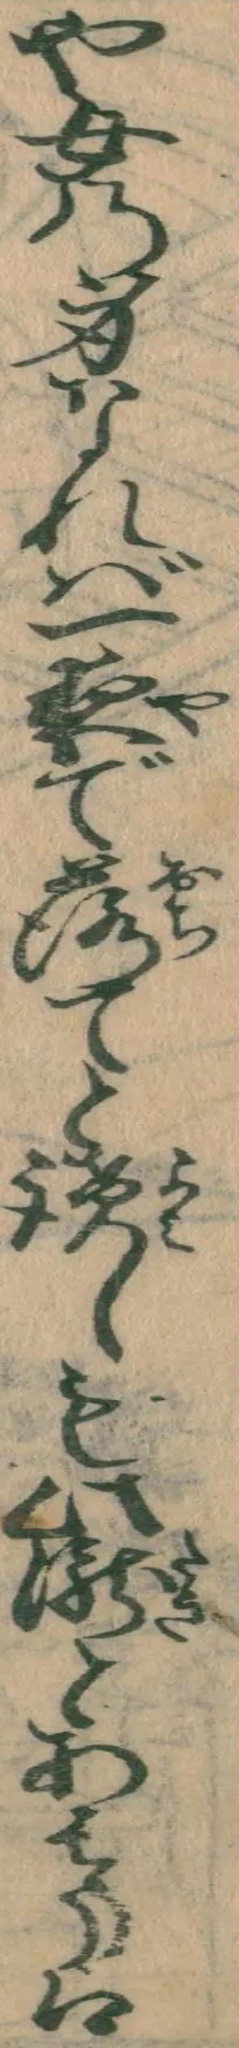や女の身なれば一夜で落てと読しも此滝とあはう口
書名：新竹斎 5巻
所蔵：国立国会図書館 National Diet Library, JAPAN
